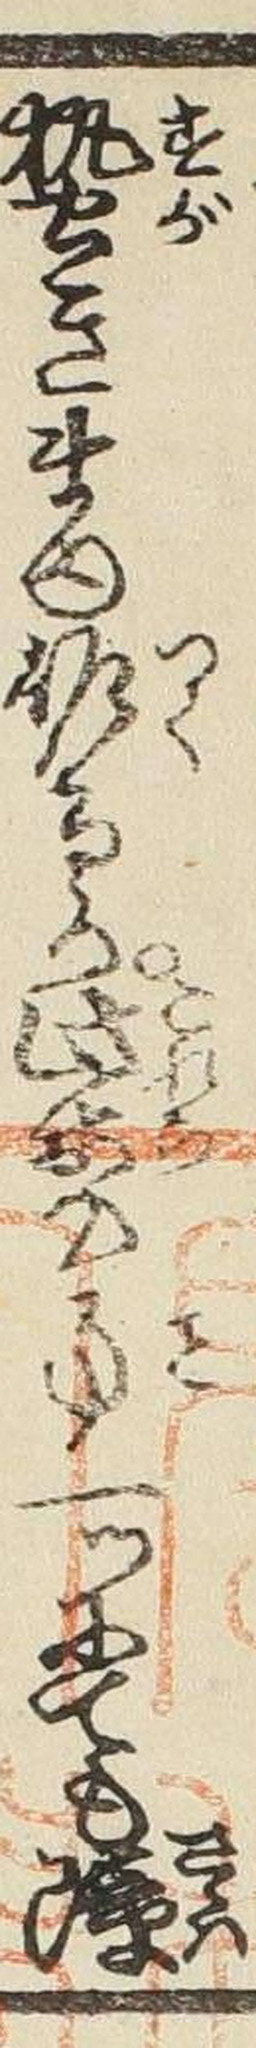蟄きまゆ作るか。此等の事一つにても障
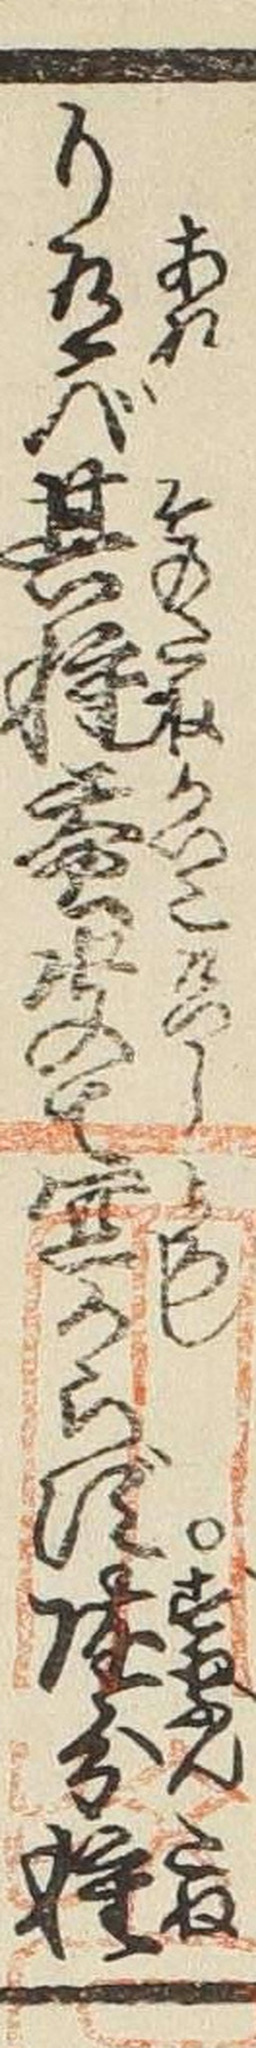り有ば其種蚕決て宜からず。随分種
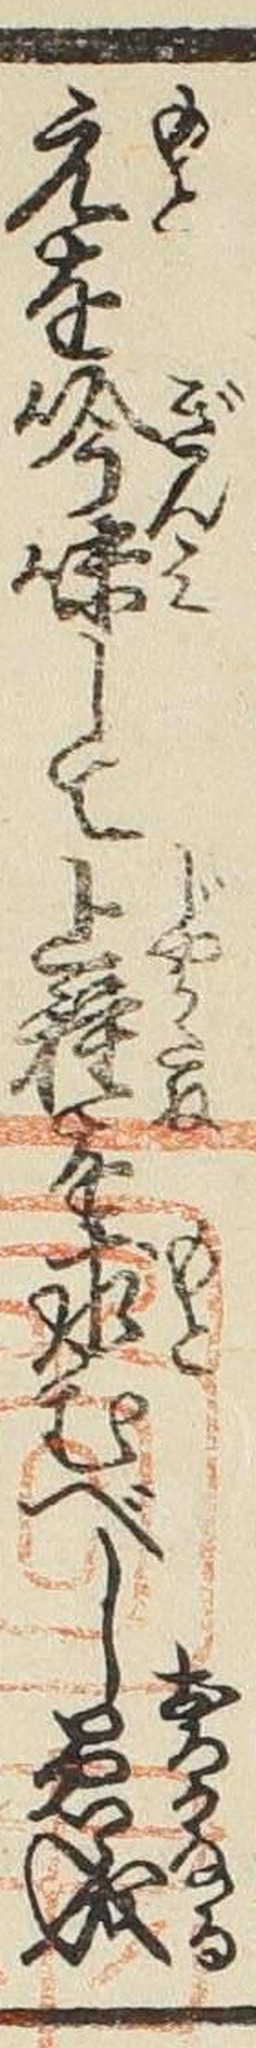元を吟味して上種を求むべし愚成
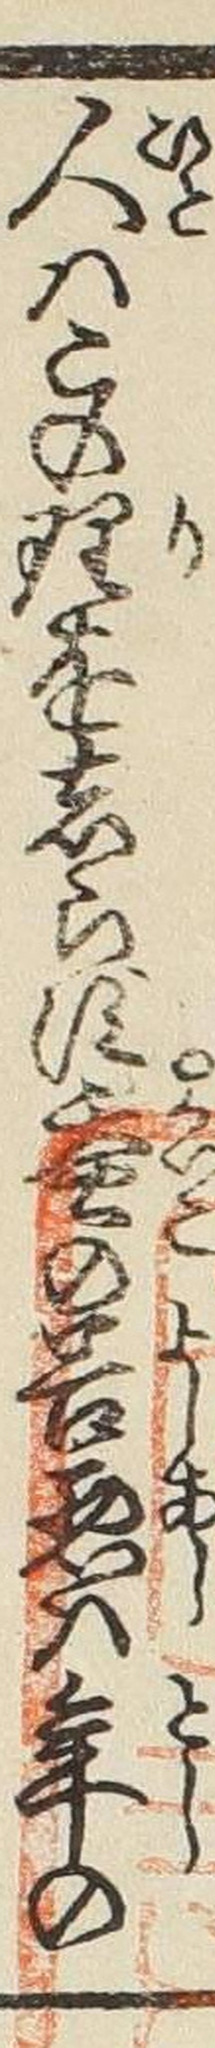人はこの理をしらず。蚕の善悪は年の
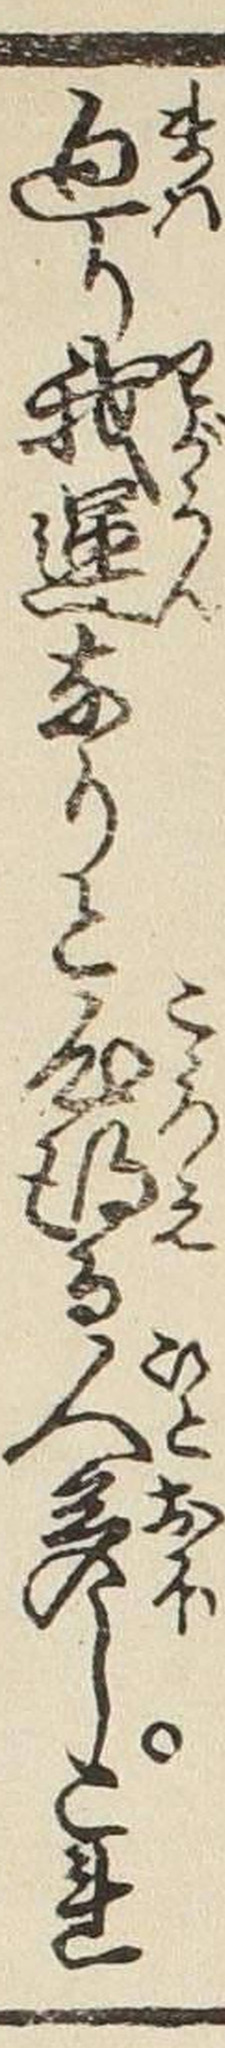廻り我運なりと心得る人多し。これ
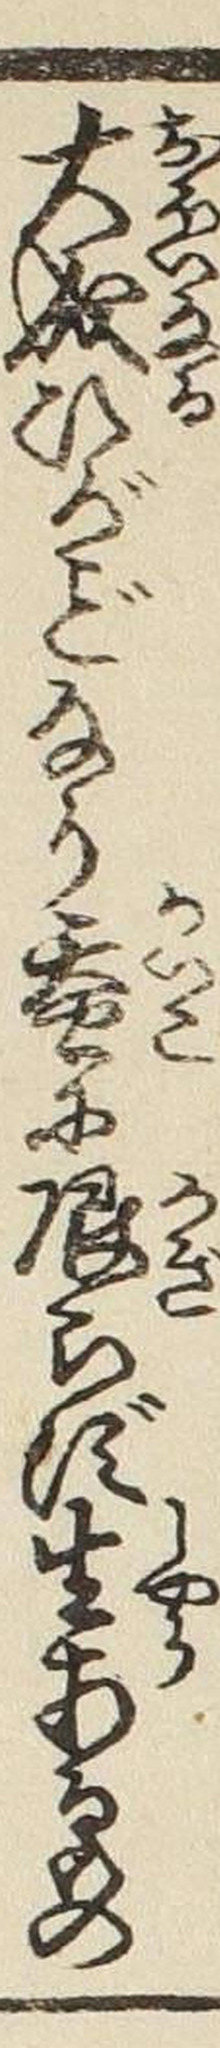大成ひがごとなり。蚕に限らず生あるもの
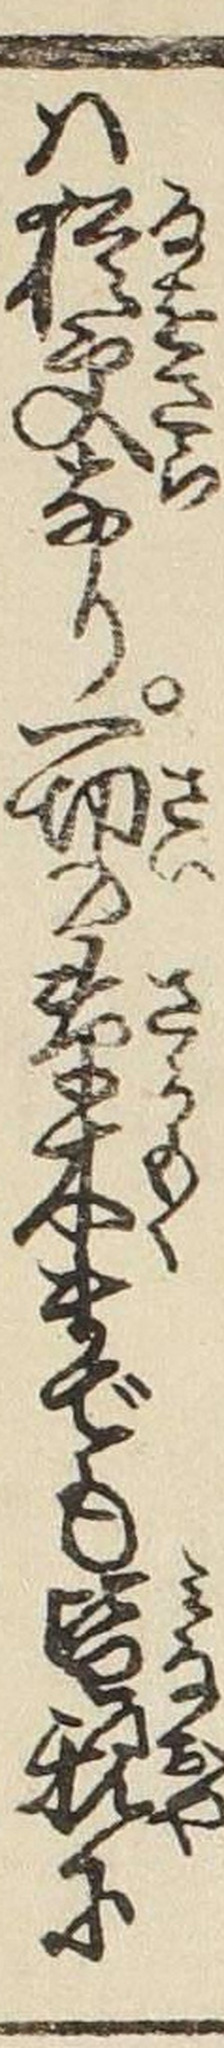は猶更なり。一切の草木までも皆親に
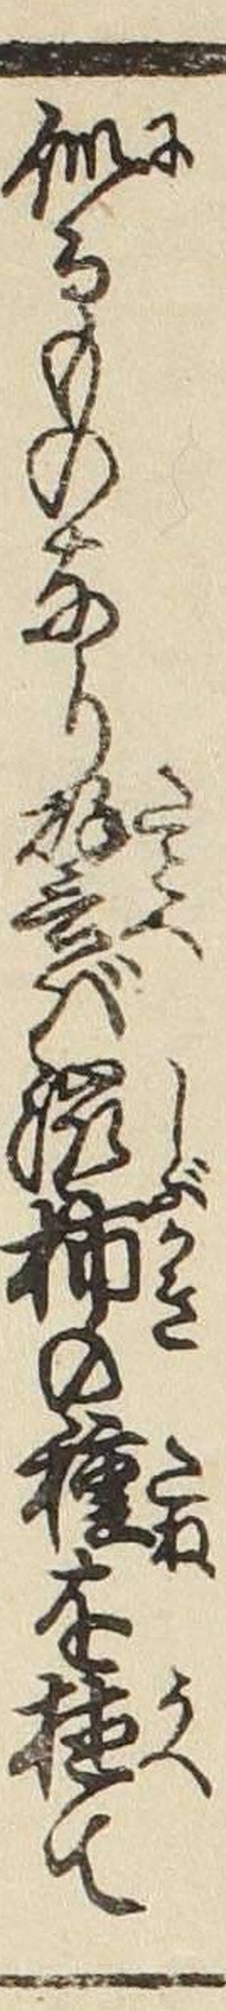似るものなり譬ば渋柿の種を植て
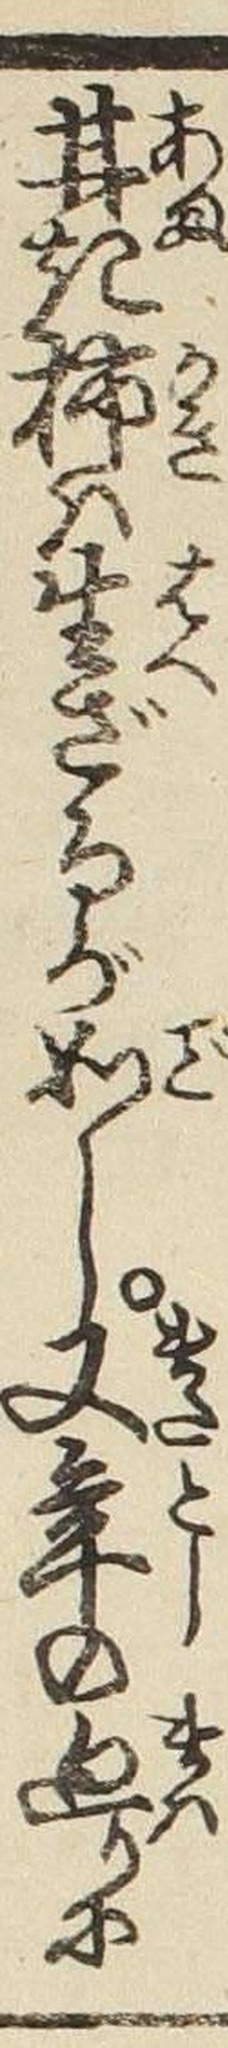甘き柿は生ざるが如し。又年の廻りに
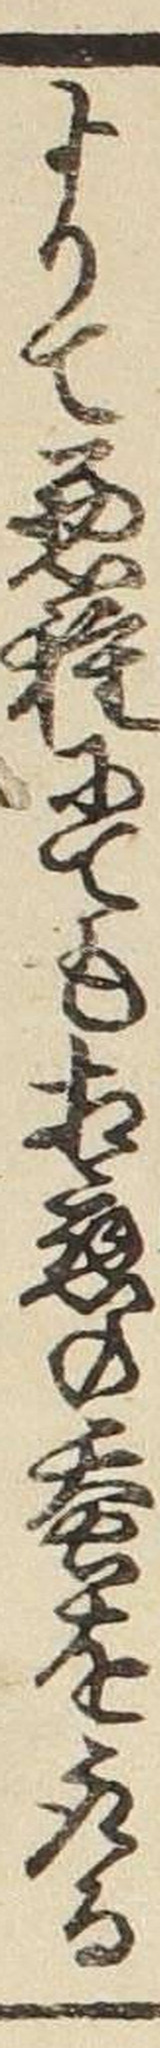よりて悪種にても相応の蚕を取る
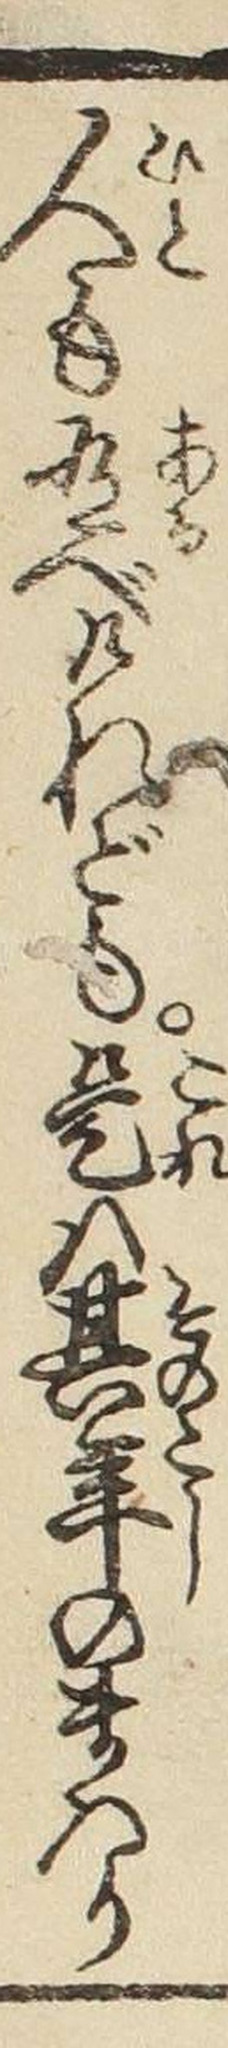人も有べけれども。是は其年のまはり

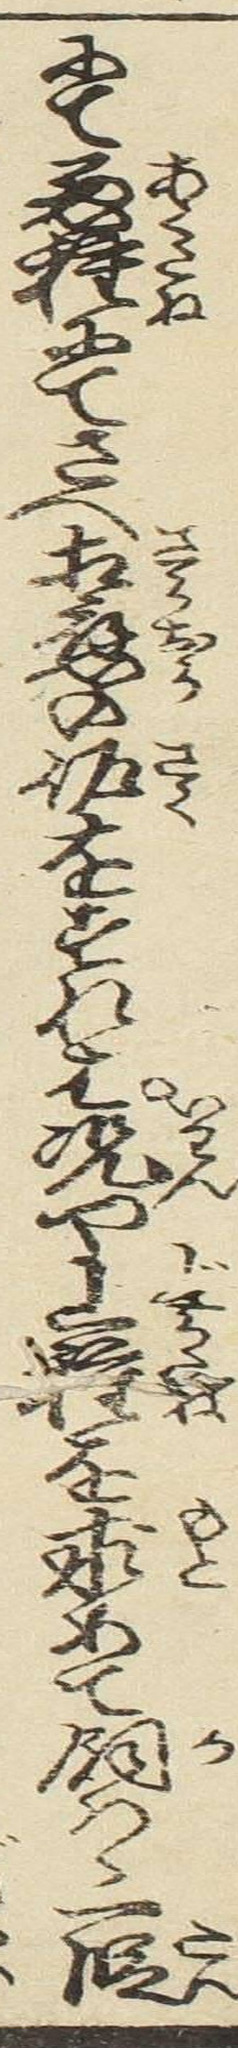にて悪種にてさへ相応の作をすれは。況や上種を求めて飼はゝ一段
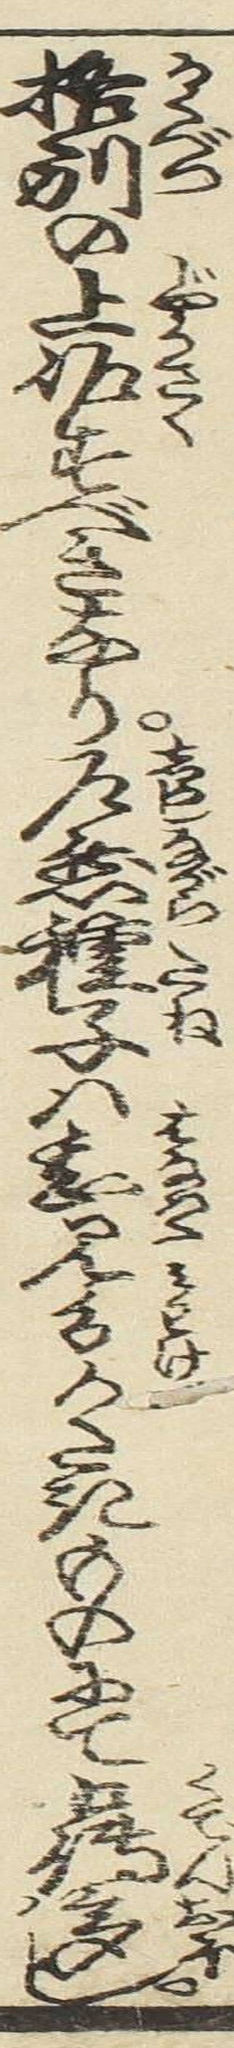格別の上作すべきなり。乍然種子は甚見分かたきものにて口伝多し。
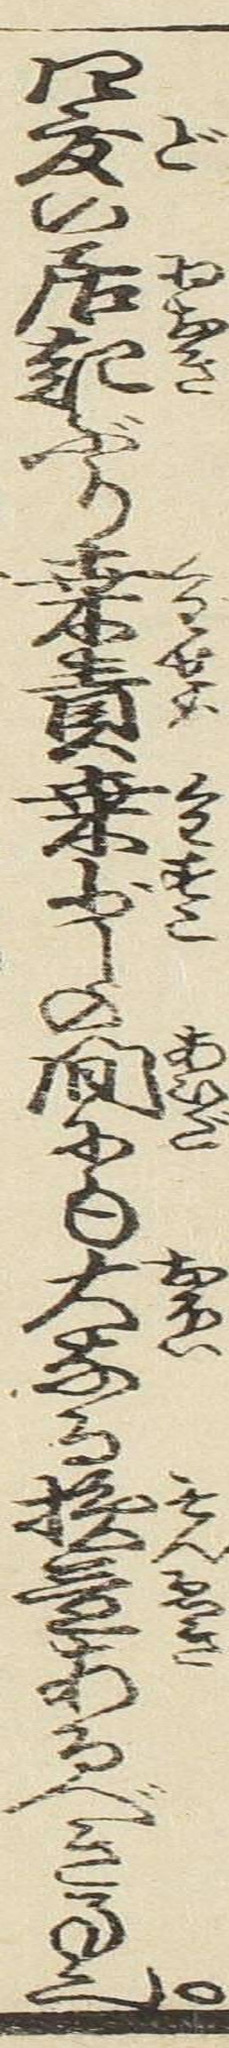四度の居起ぶり桑責桑少しの間にも大なる損益あるべき事也。
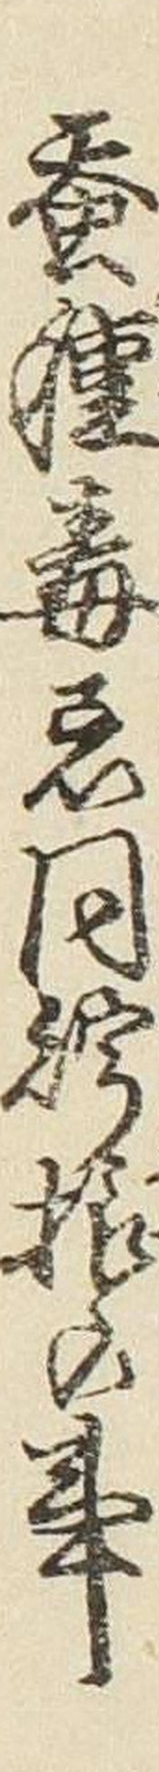蚕種毒忌同貯様の事
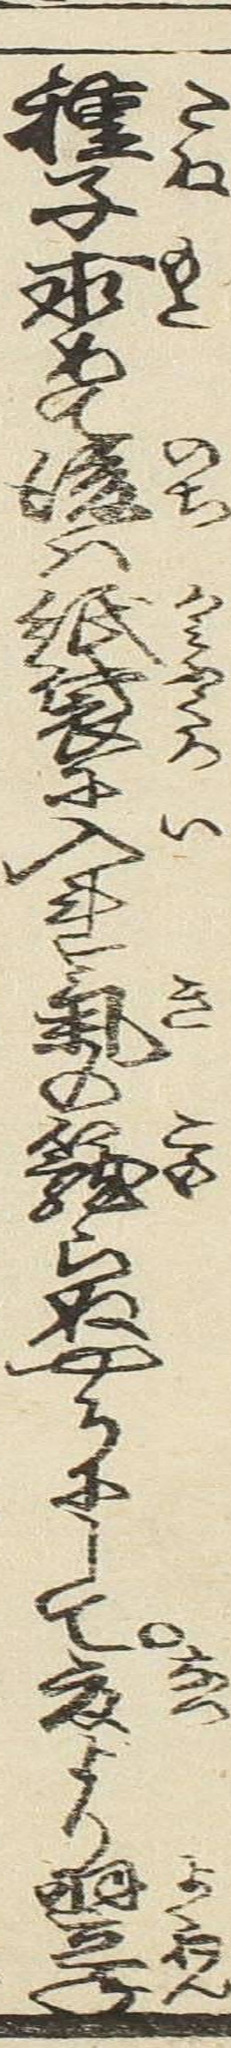種子求めて後は紙袋に入れ気の籠らぬやうにして。夏より翌年
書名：養蠶圖解
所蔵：東京大学農学生命科学図書館 国文学研究資料館
